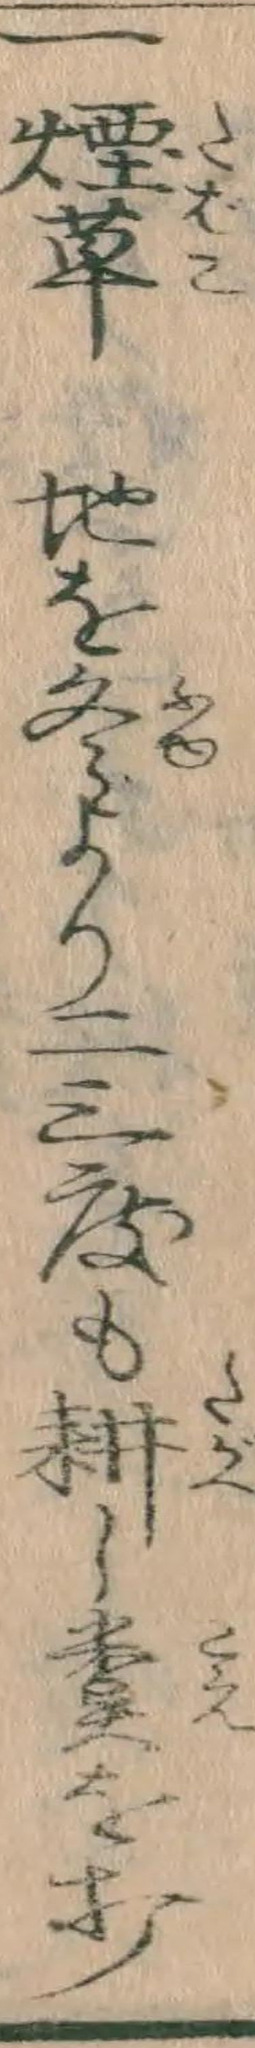一煙草地を冬より二三度も耕し糞を打
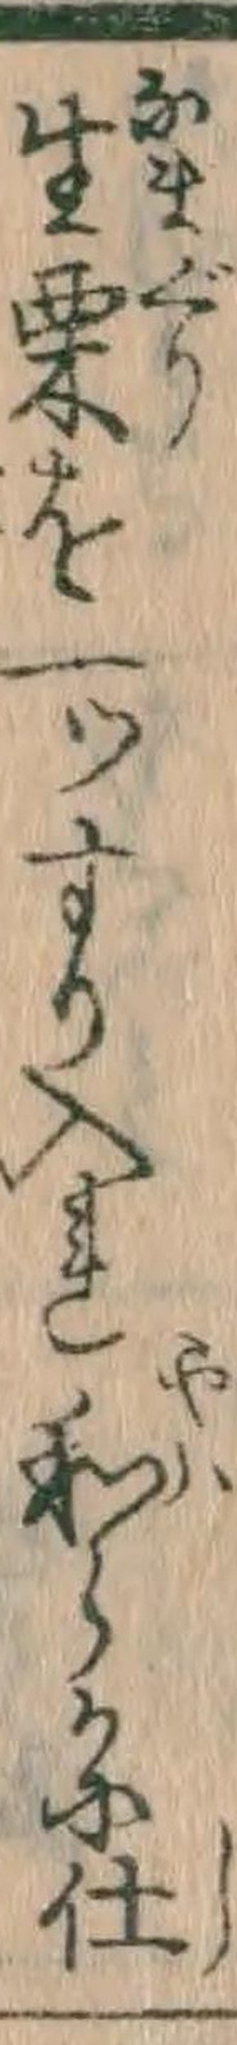生栗を一ッすり入れ和らかに仕
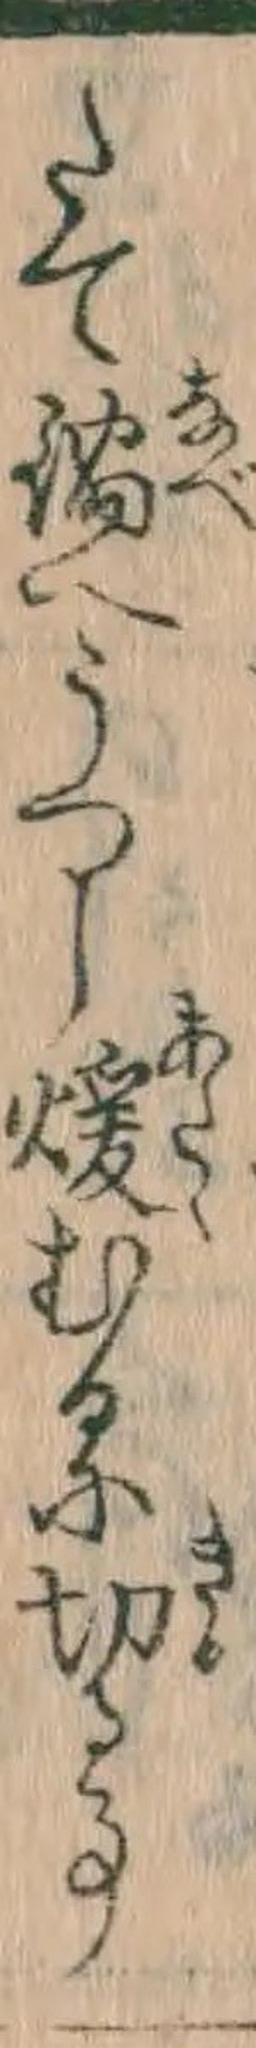たて鍋へうつし煖むるに切る事
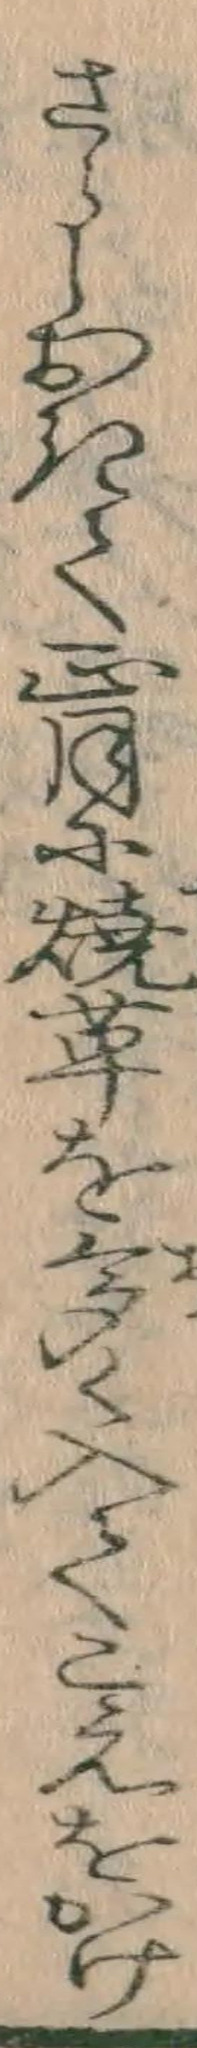さらしおきて正月に焼草を多く入てこえをかけ
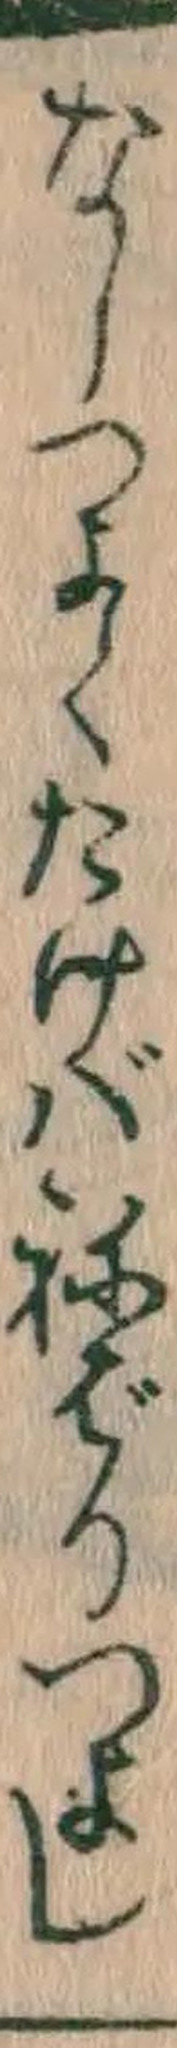なしつよくたけばねばりつよし
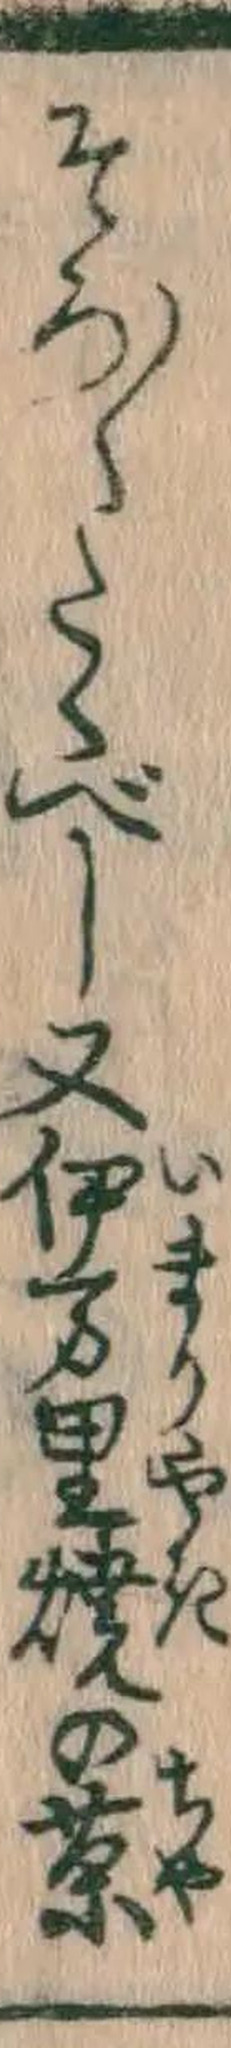そろ〳〵たくべし又伊万里焼の茶
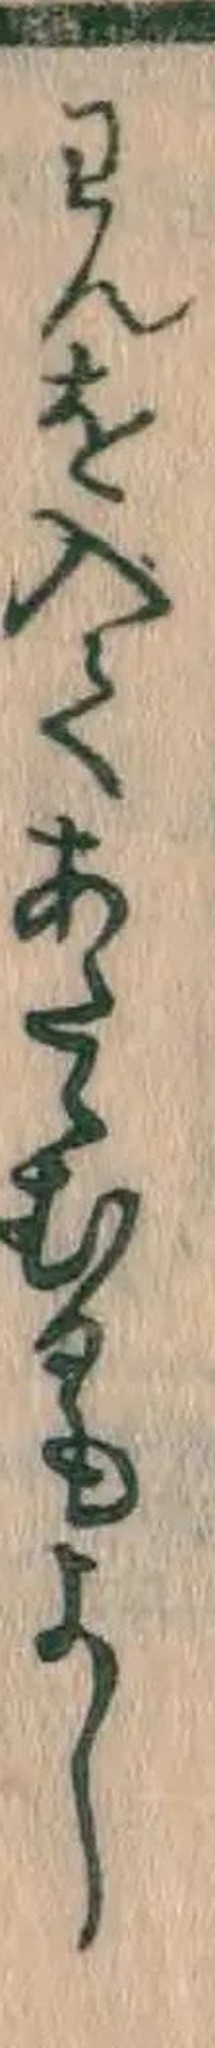わんを入てあたゝむるもよし
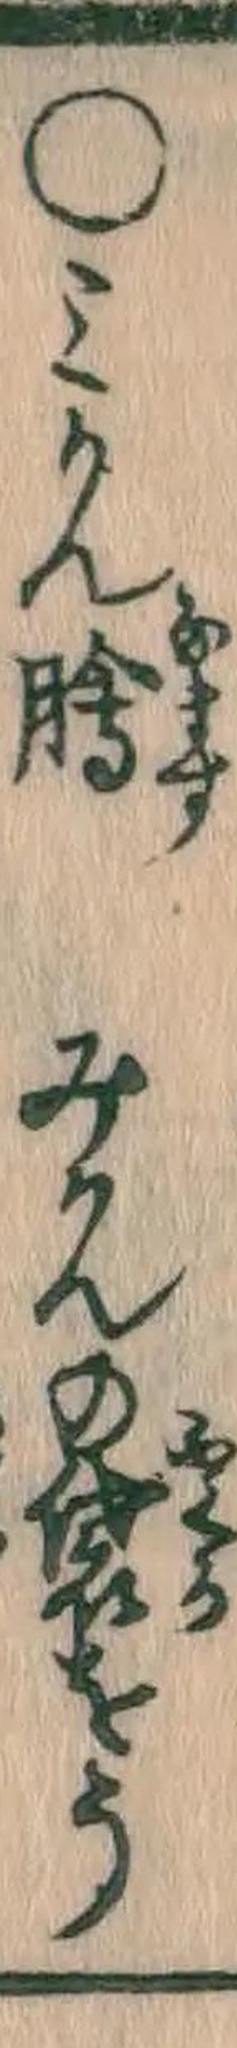○みかん鱠みかんの袋をう
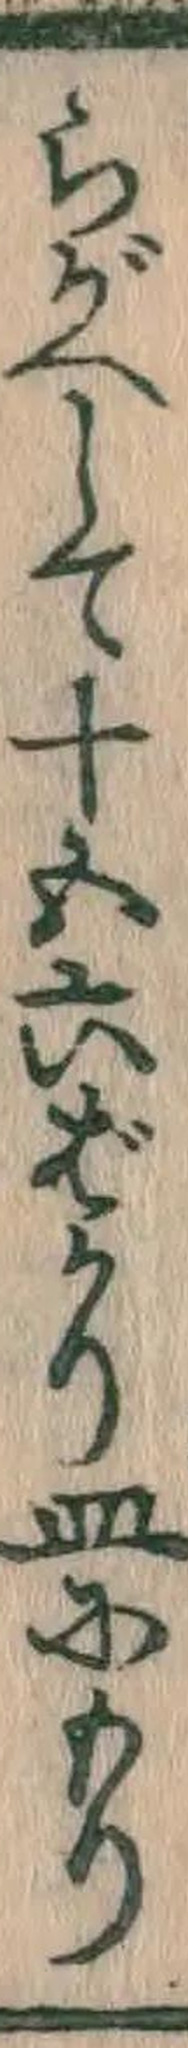らがへして十五六ばかり皿にもり
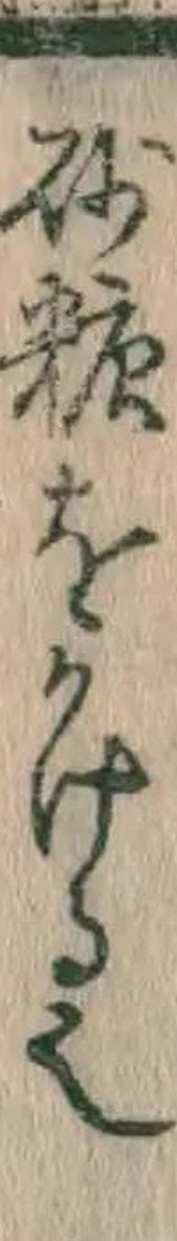砂糖をかける也
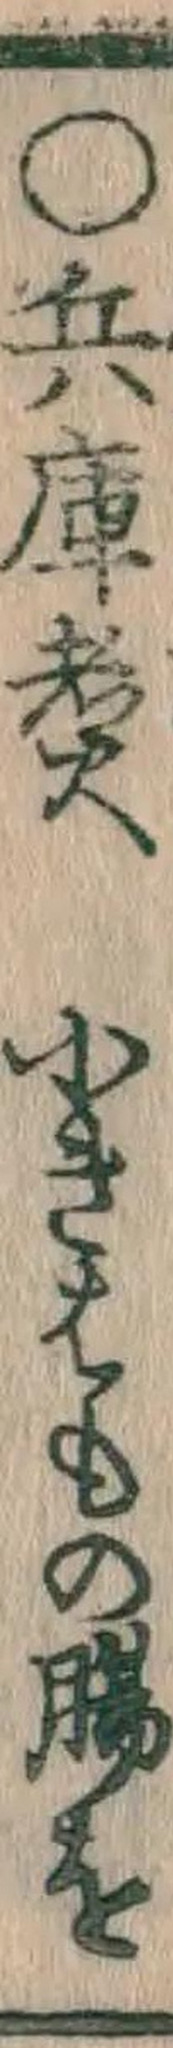○兵庫煮小きはもの腸を
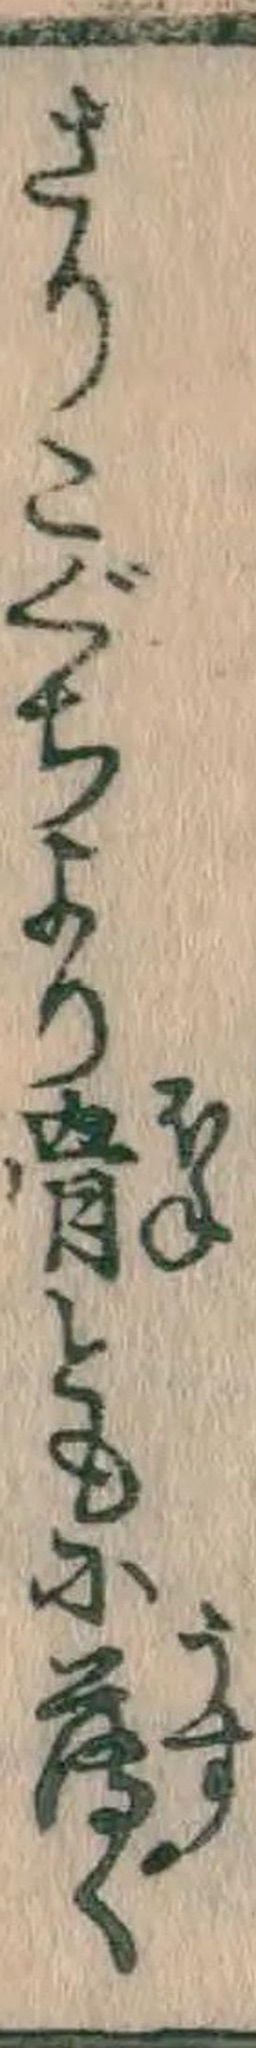さりこぐちより骨ともに薄く
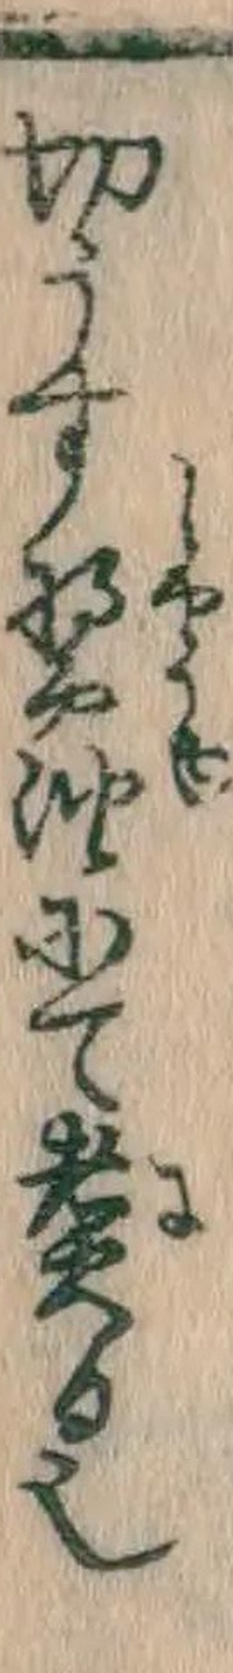切うす醬油にて煮る也
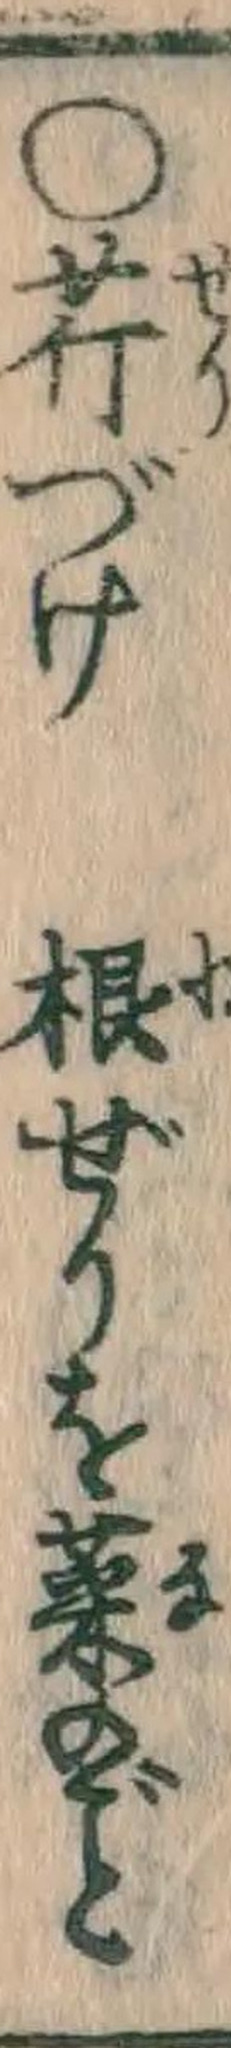○芹づけ根ぜりを菜のごと
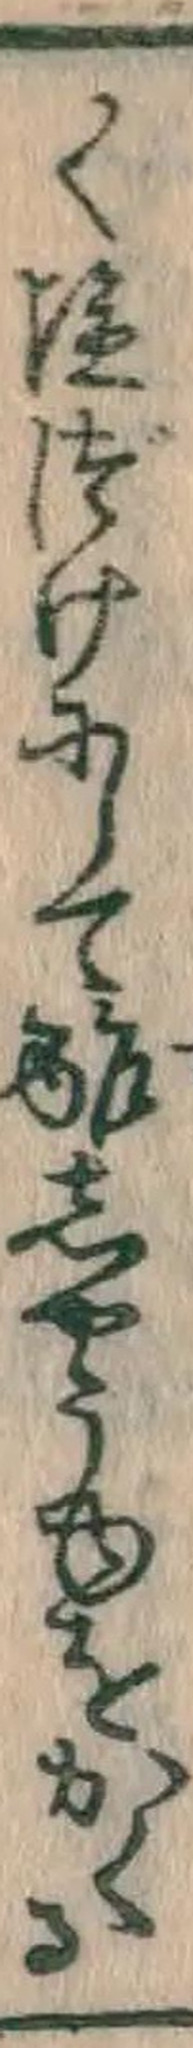く塩づけにして酢しやうゆをかくる
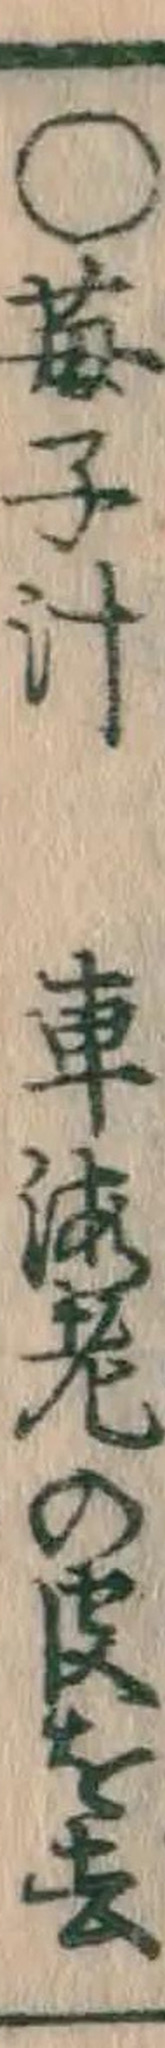○苺子汁車海老の皮を去
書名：広益秘事大全 3巻. [5]
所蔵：国立国会図書館 National Diet Library, JAPAN
